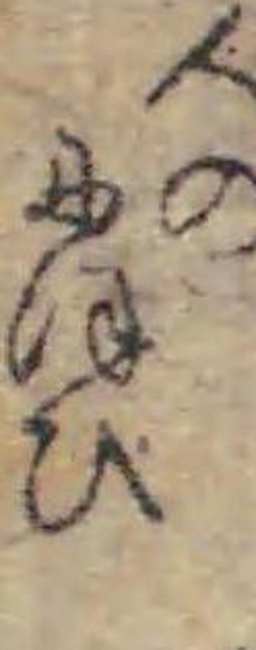にほひ
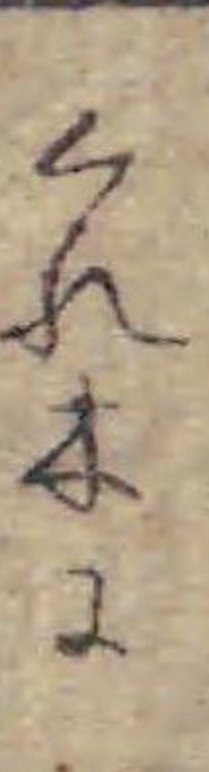くれ木に
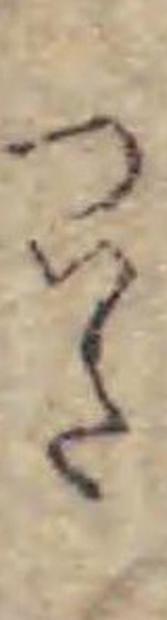ついた
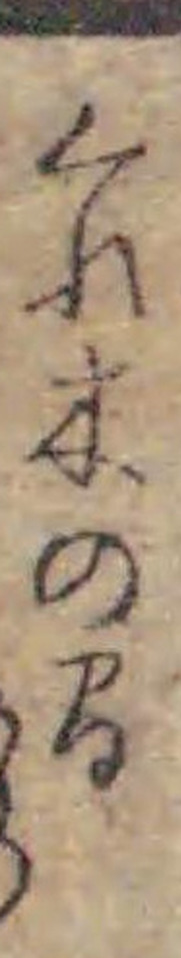くれ木の間
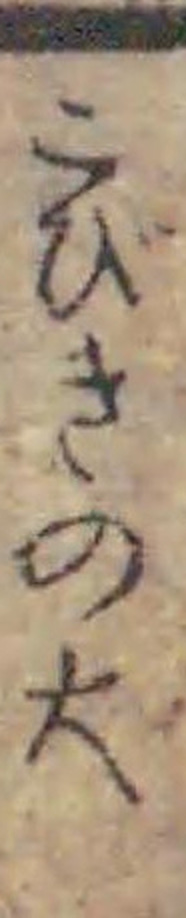こびきの大
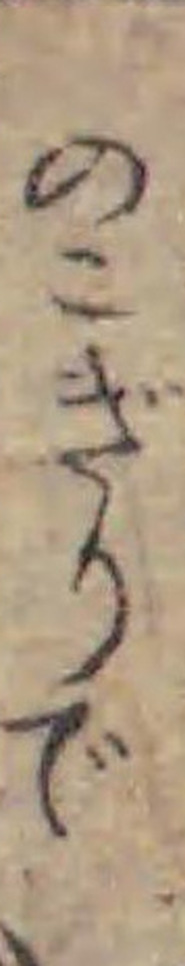のこぎりで
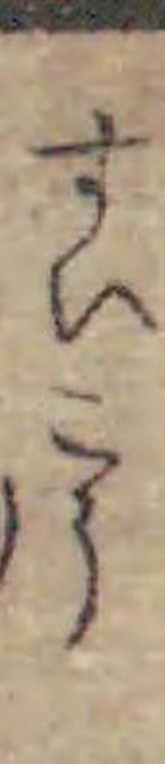すいこう

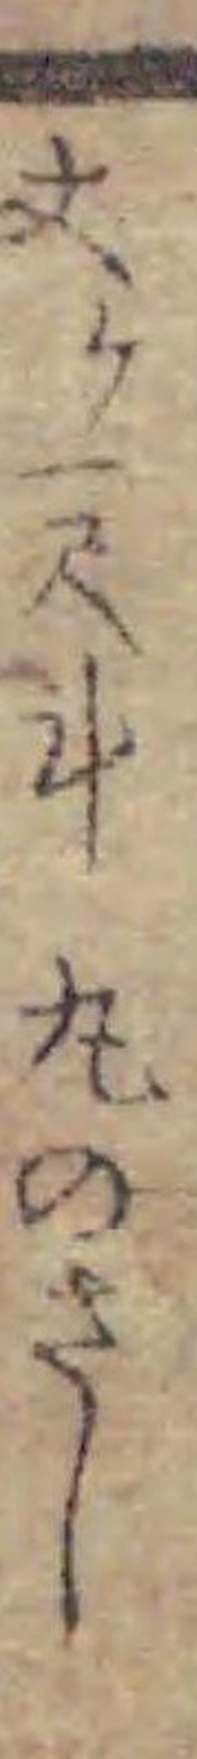丈一尺斗丸のさし
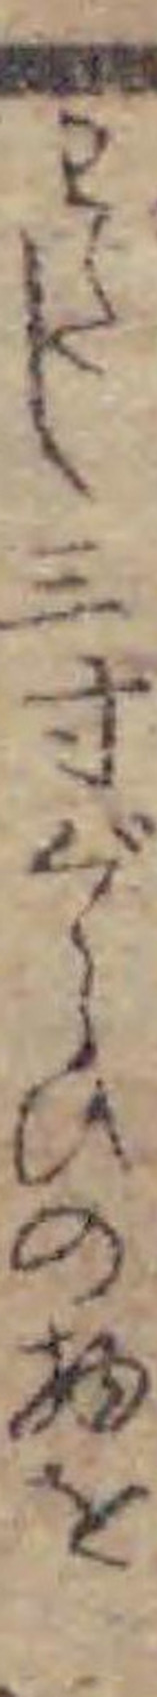わたし三寸ぐらひの物を
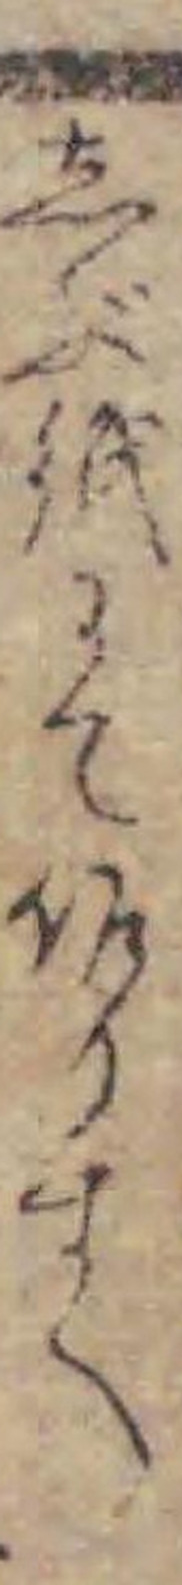しぶ紙にて作りすへ
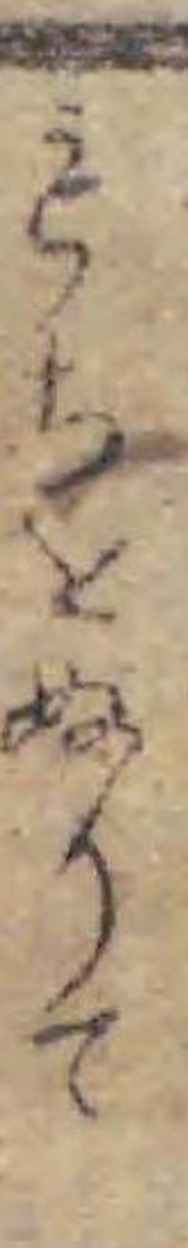もちをぬりて
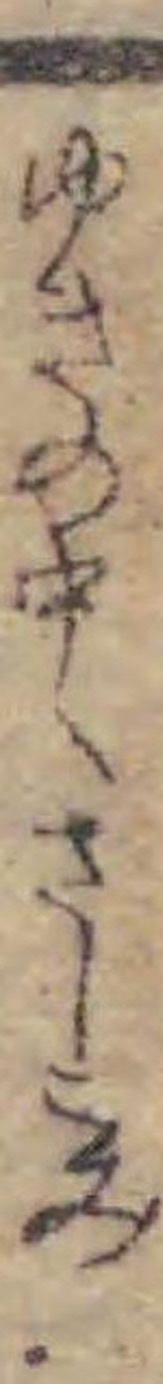ゆきの中へさしこみ
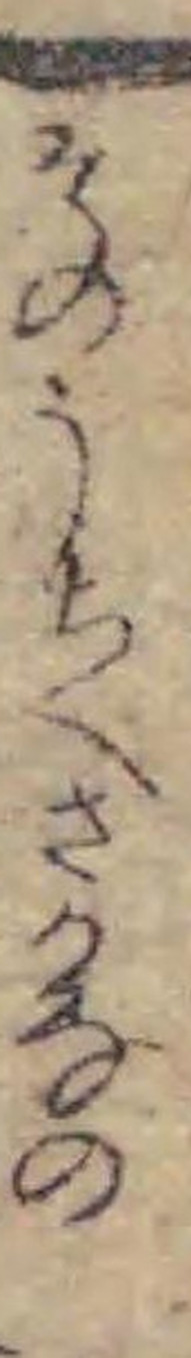そのうちへさかなの
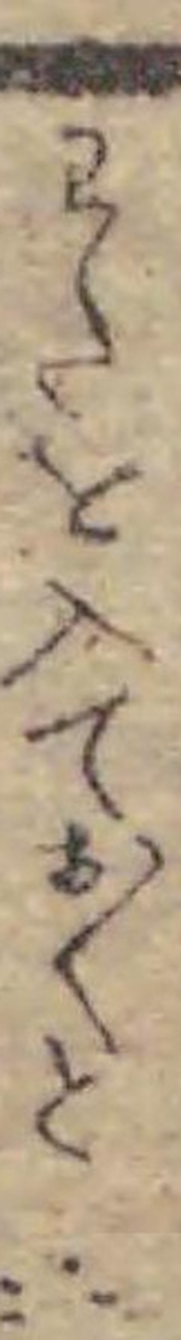わたを入ておくと
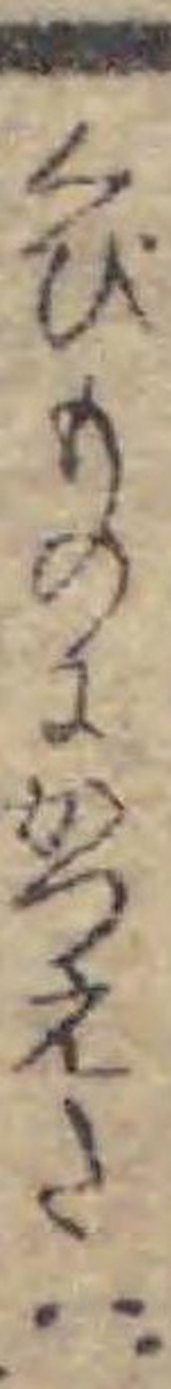くひものにかつえた
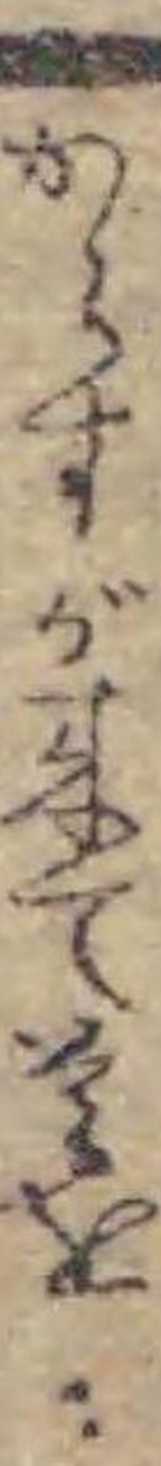からすが来て首を
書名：虚言八百万八伝 : 3巻
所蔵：国立国会図書館 National Diet Library, JAPAN
